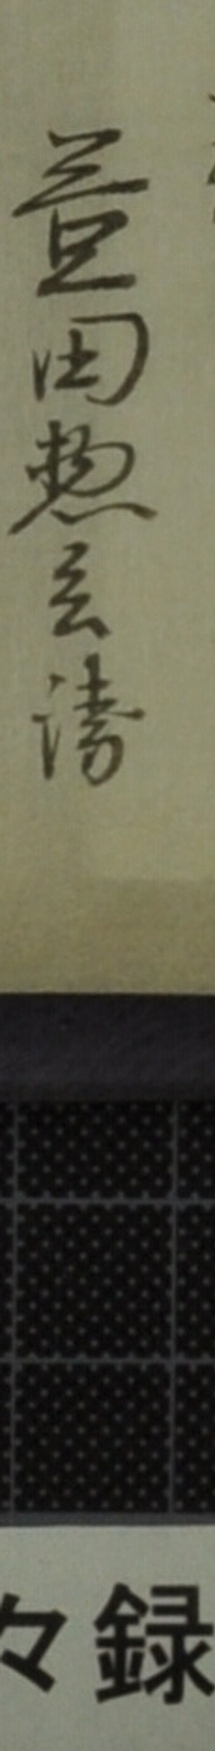益田惣兵衛
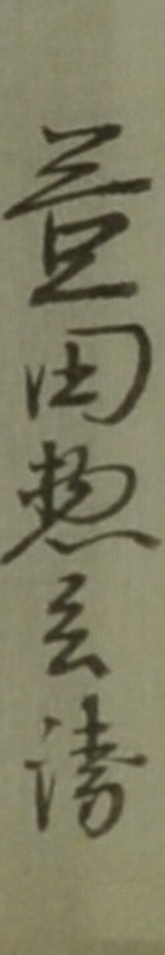益田惣兵衛
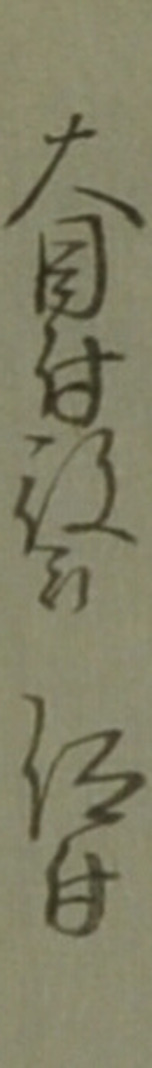大目付役被仰付
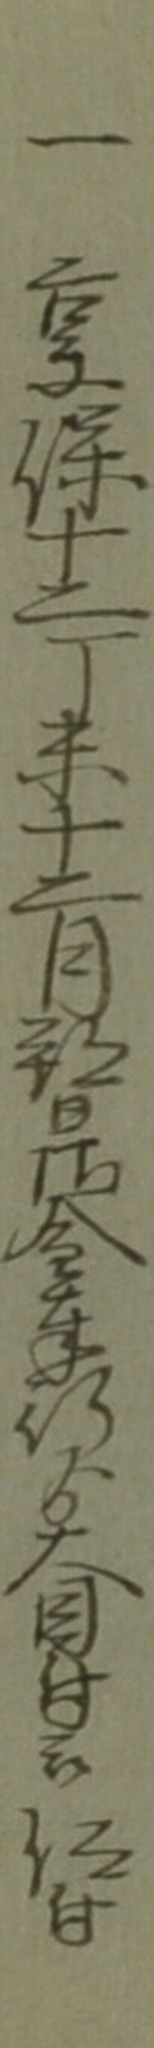一享保十二丁未十二月朔日御金奉行ゟ大目付被仰付
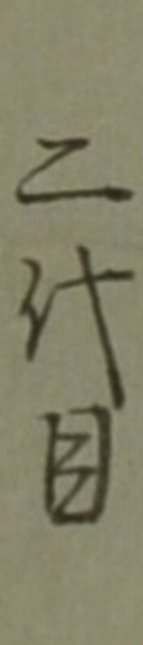二代目
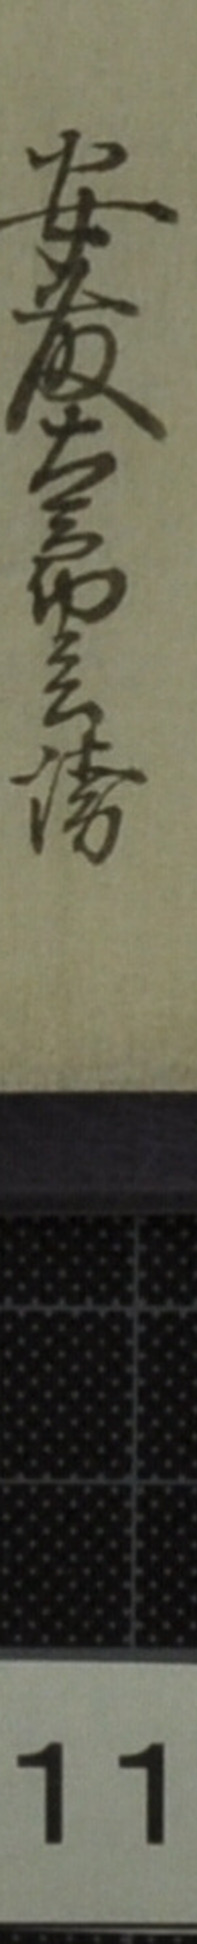安藤太郎兵衛
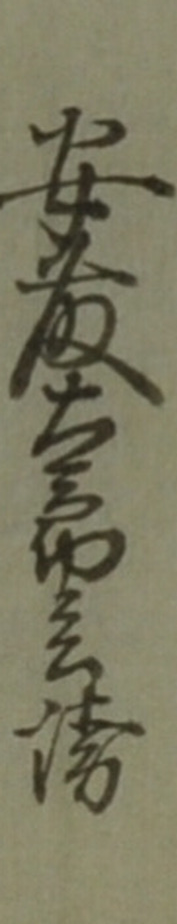安藤太郎兵衛
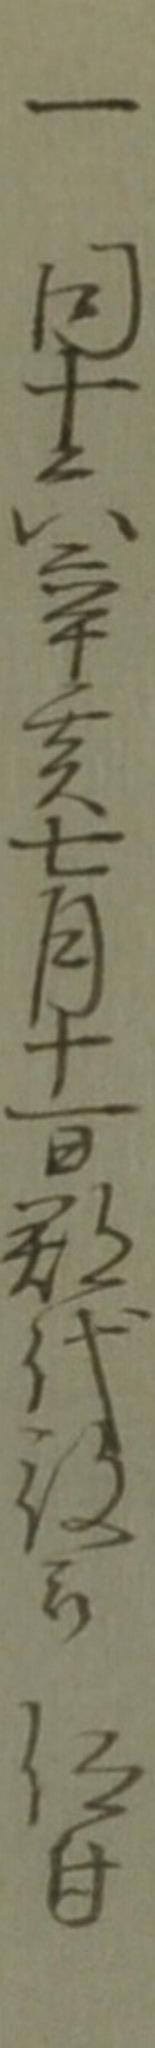一同十六辛亥七月十一日郡代役被仰付
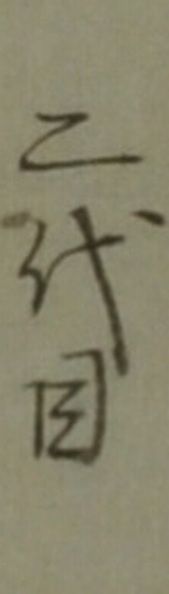二代目
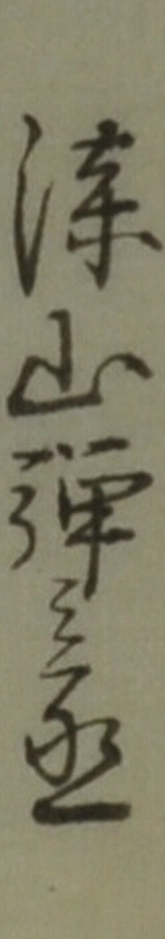津山弾之丞
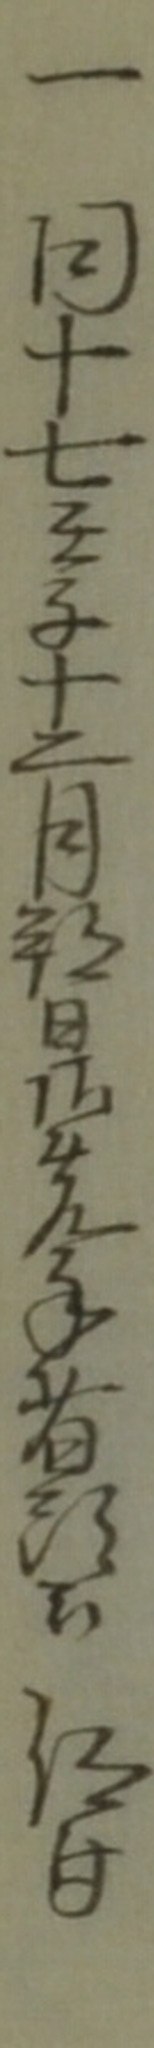一同十七壬子十二月朔日御先手者頭被仰付
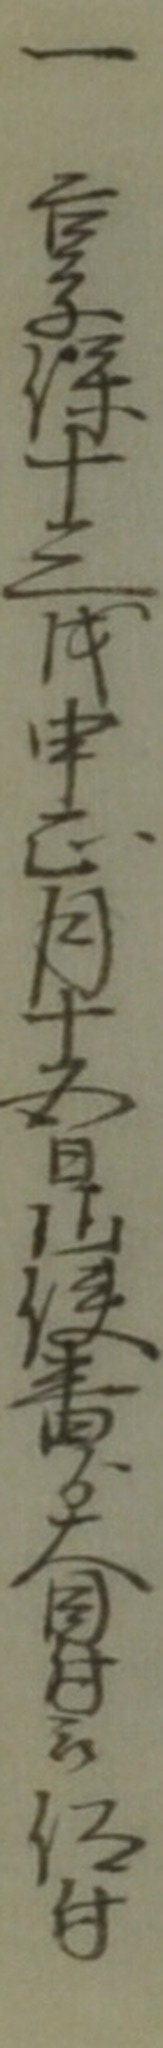一享保十三戊申正月十五日御使番ゟ大目付被仰付
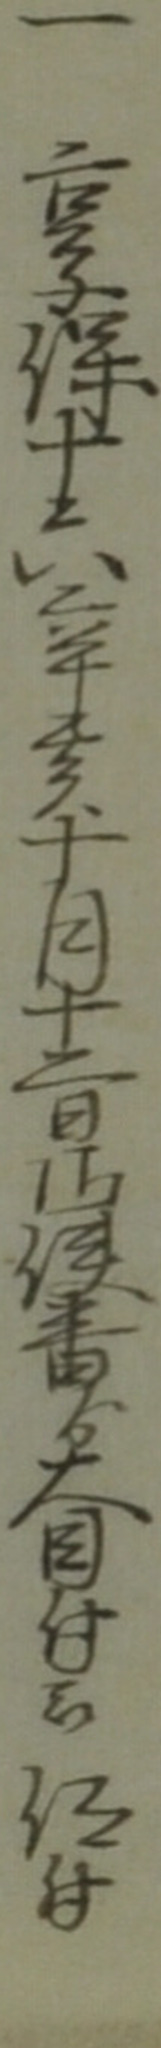一享保十六辛亥十月十二日御使番ゟ大目付被仰付
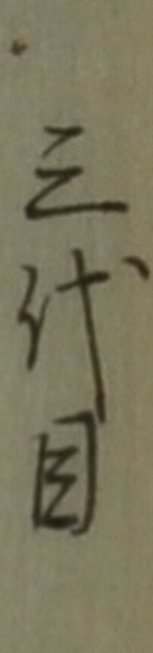三代目
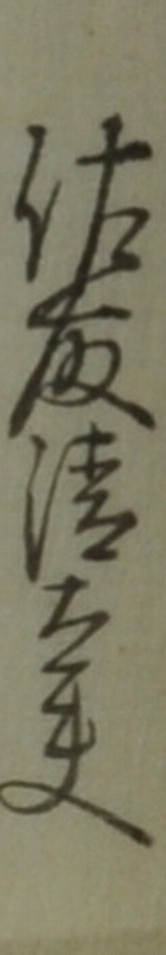佐藤清太夫
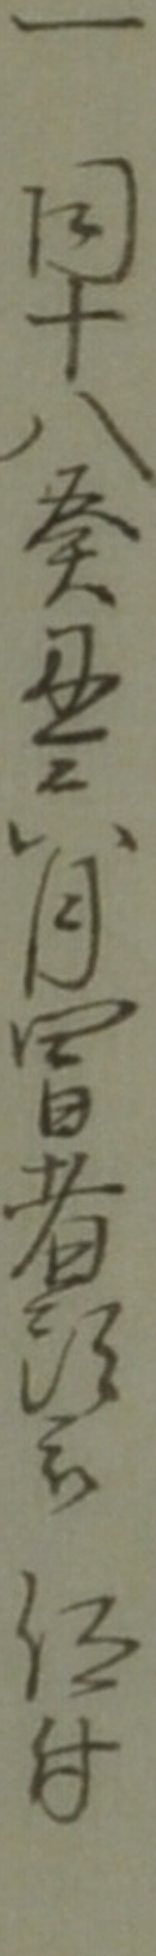一同十八癸丑六月四日者頭被仰付
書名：諸御役代々録（三）
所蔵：伊那市立高遠町図書館・合同会社AMANE
